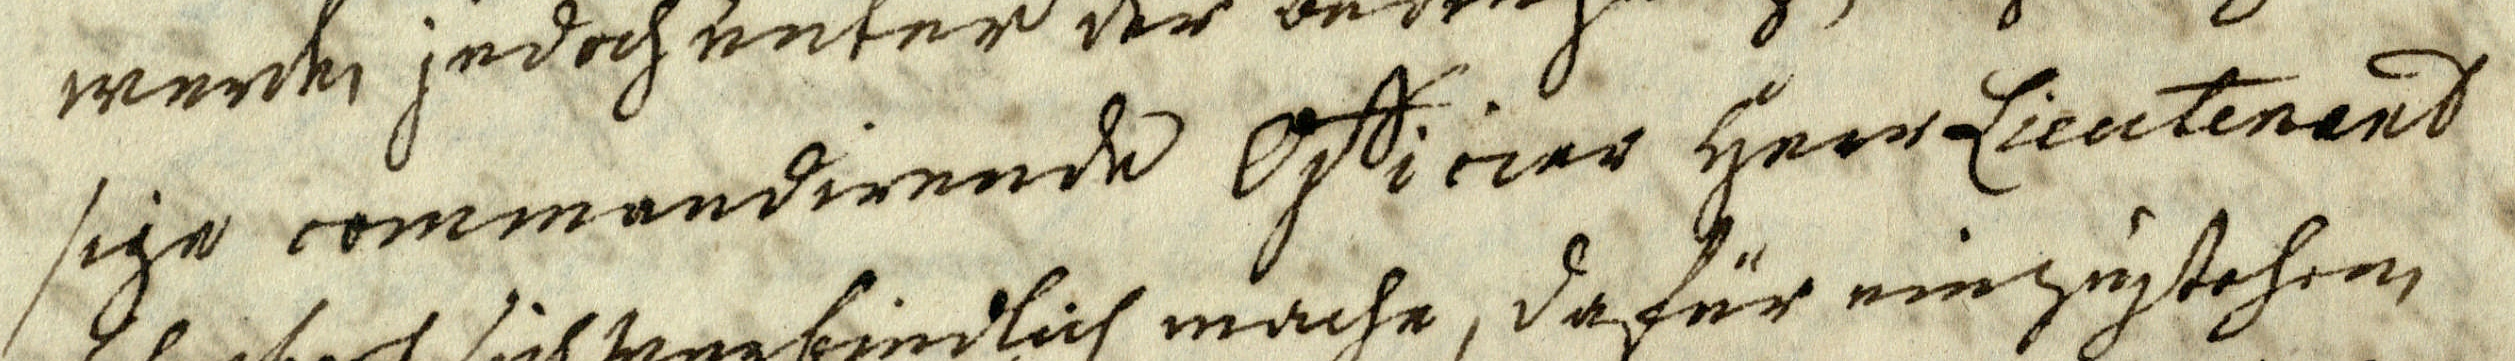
sige commandirende Officier Herr Lieutenant
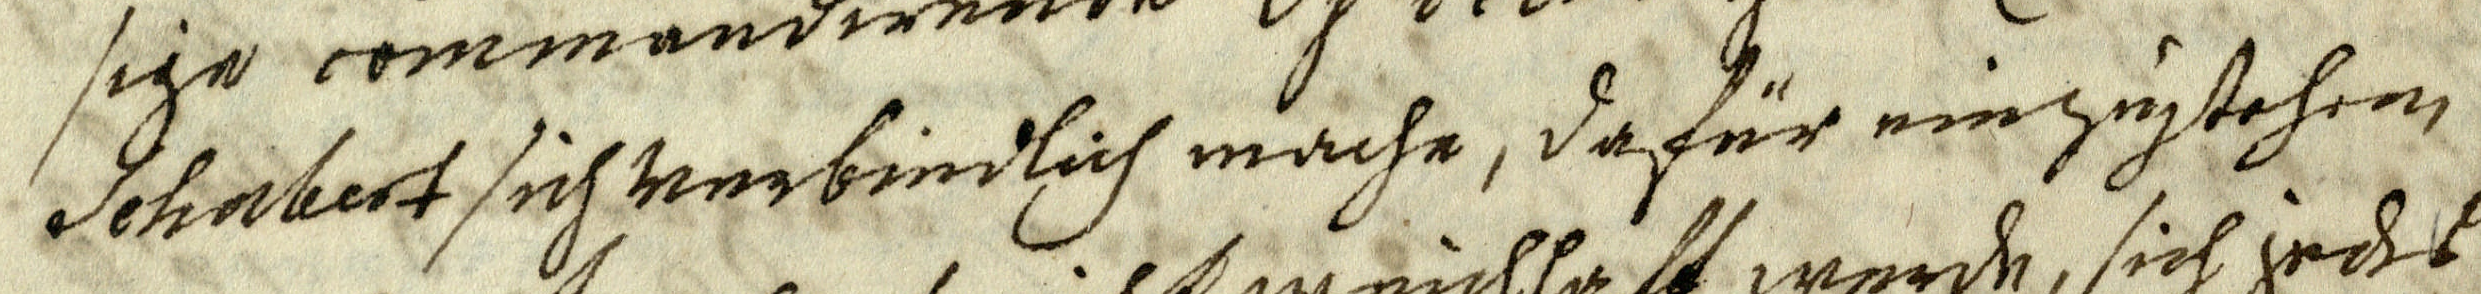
Schubert sich verbindlich mache, dafür einzustehen,
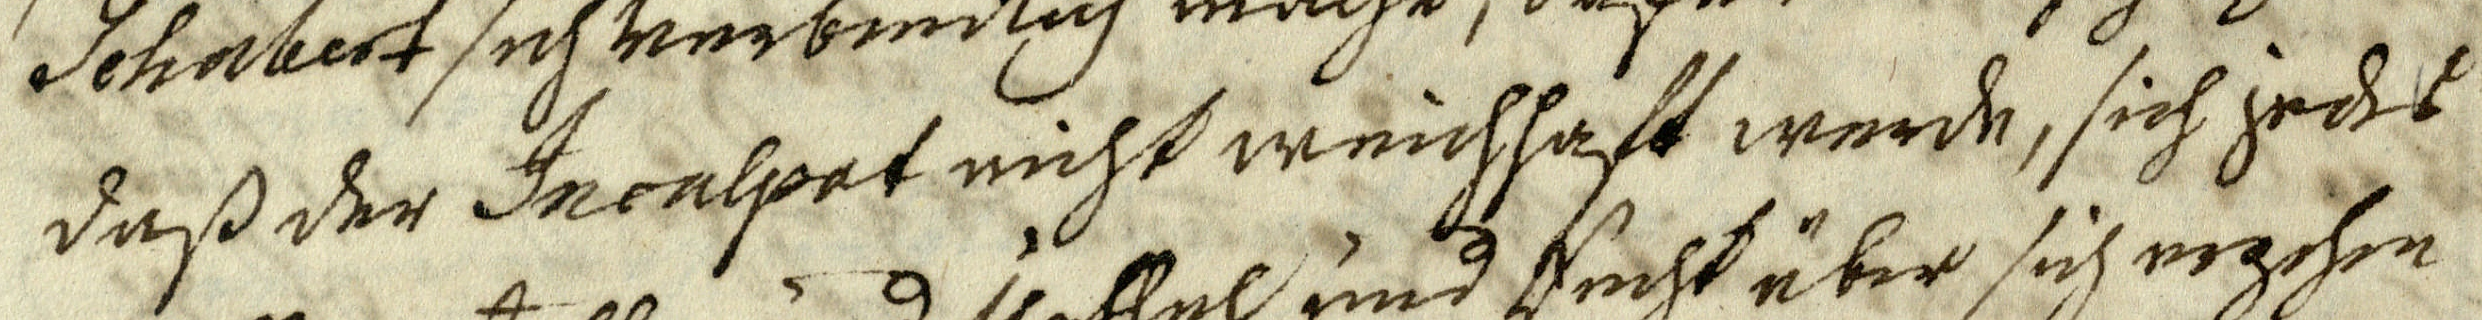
daß der Inculpat nicht weichhaft werde, sich jedes
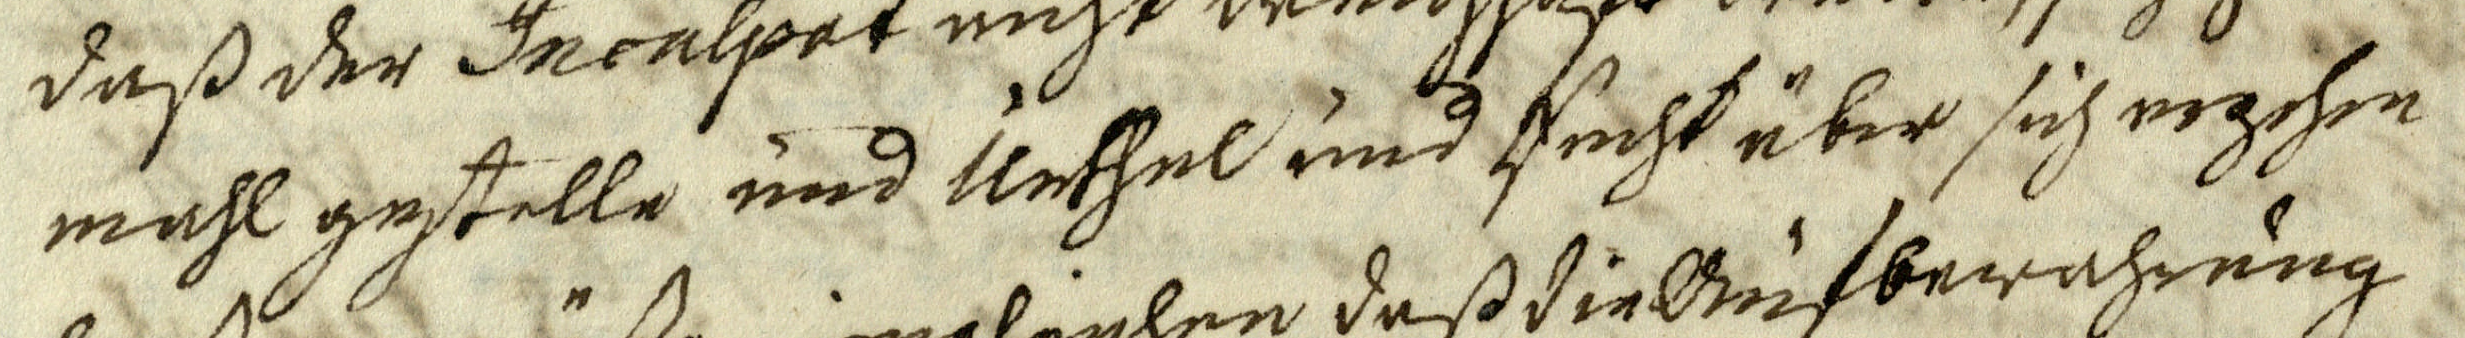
mahl gestelle und Urthel und Recht über sich ergehen
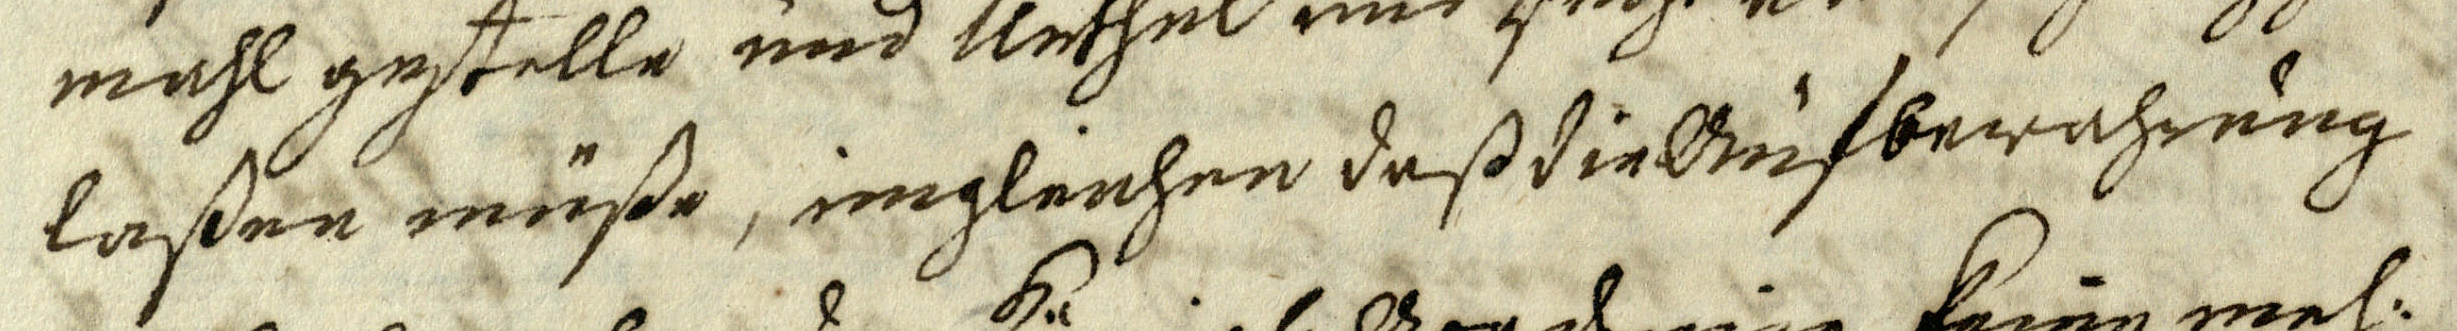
laßen müße, imgleichen daß die Aufbewahrung
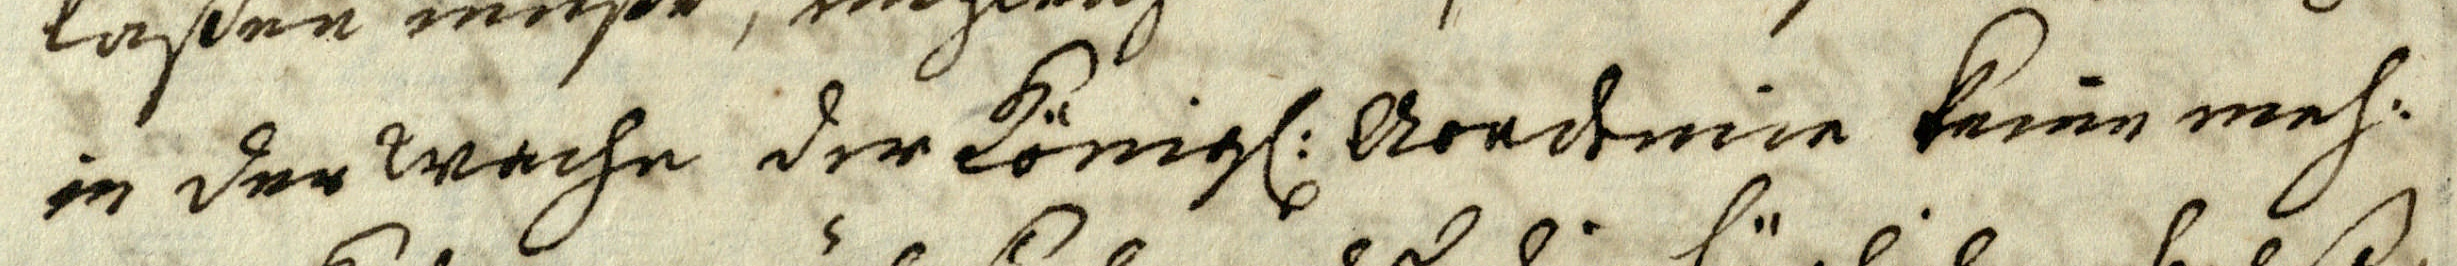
in der Wache der Königl. Academie keine meh¬
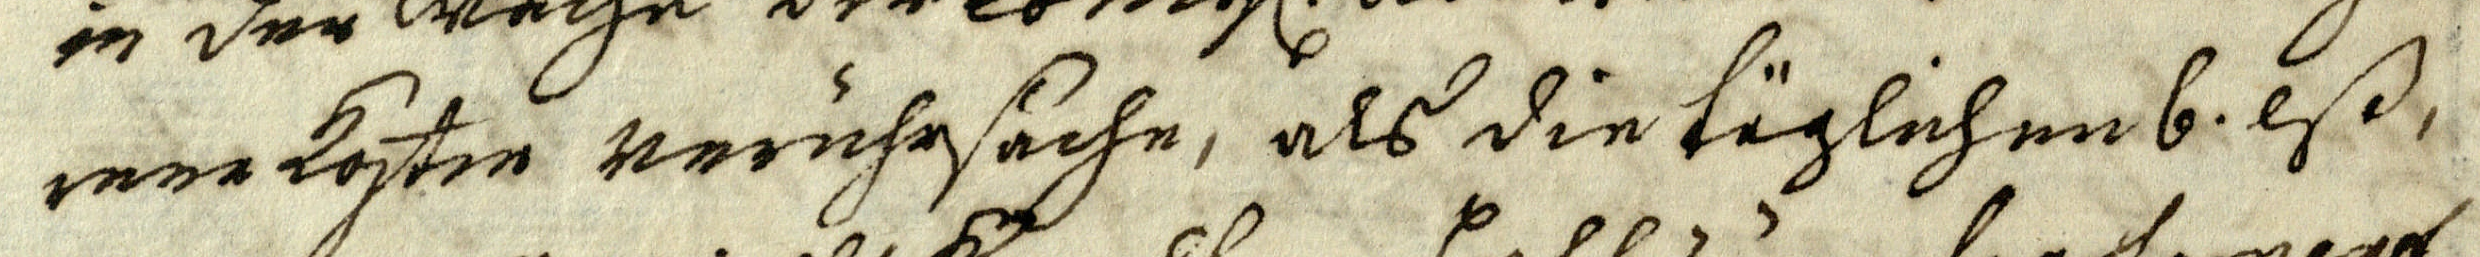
rere Kosten verursache, als die täglichen 6. s.
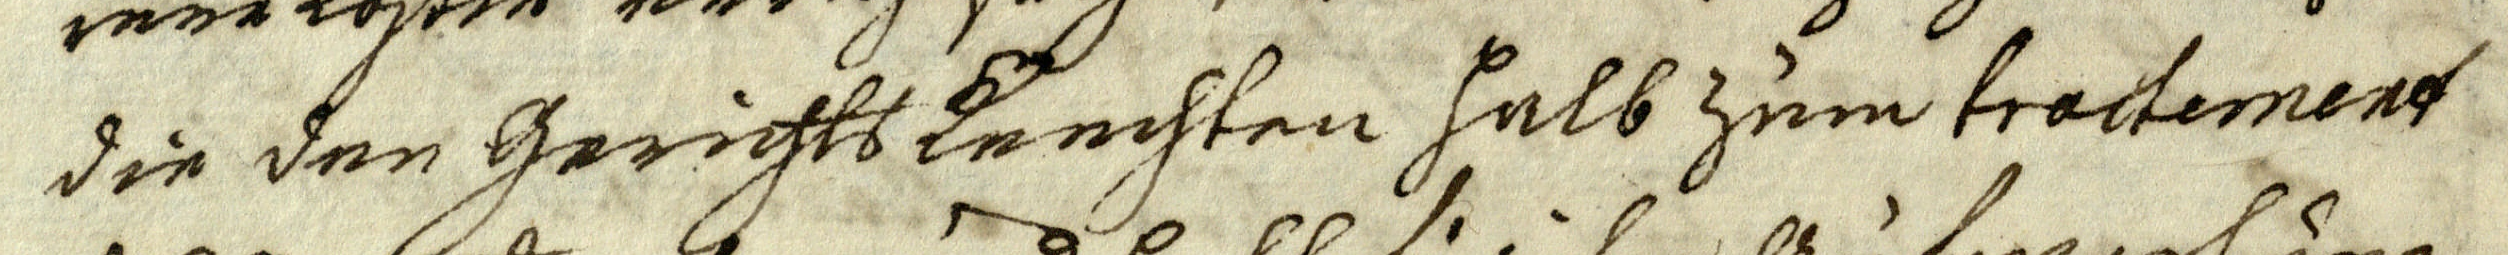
die den Gerichts Knechten halb zum tractement
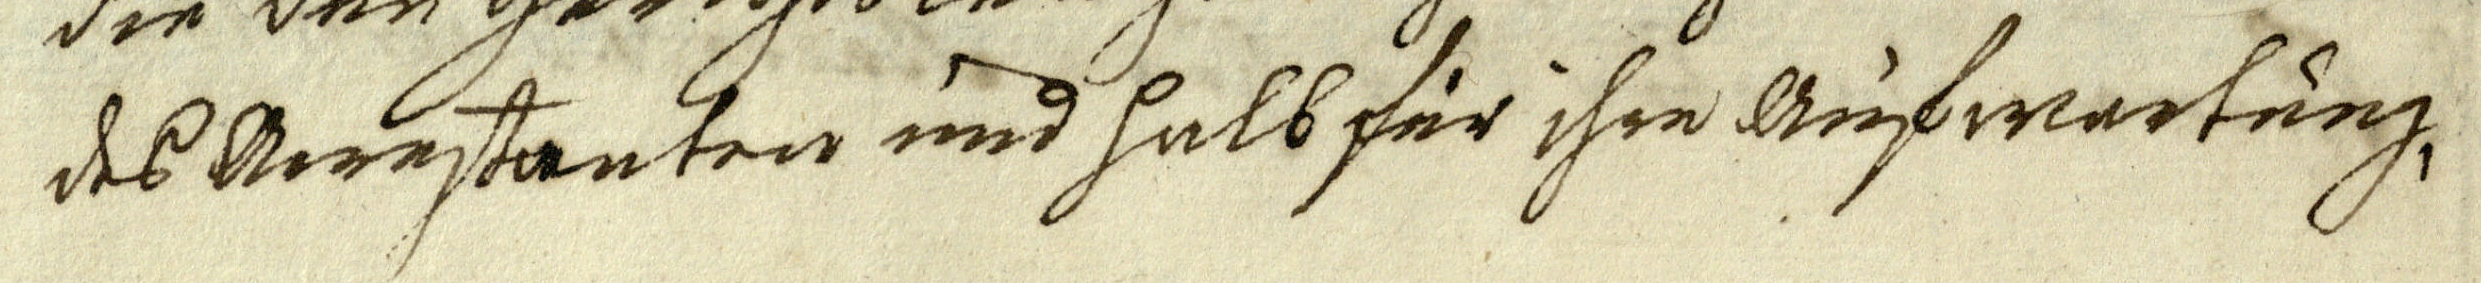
des Arrestanten und halb für ihre Aufwartung,
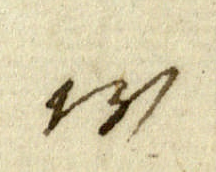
es
